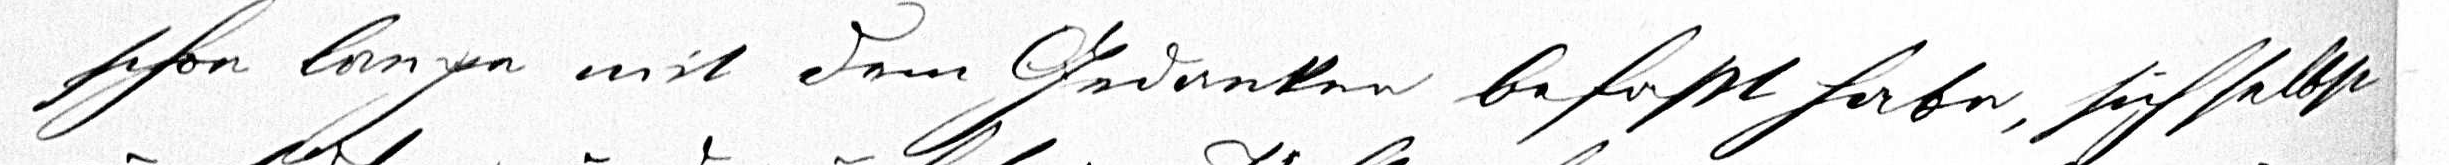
schon lange mit dem Gedanken befaßt habe, sich selbst
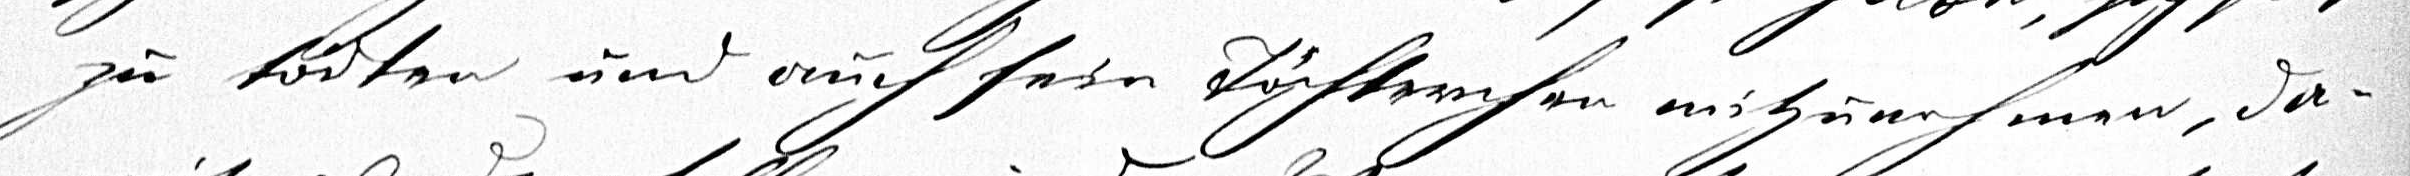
zu todten und auch sein Töchterchen mitzunehmen, da¬
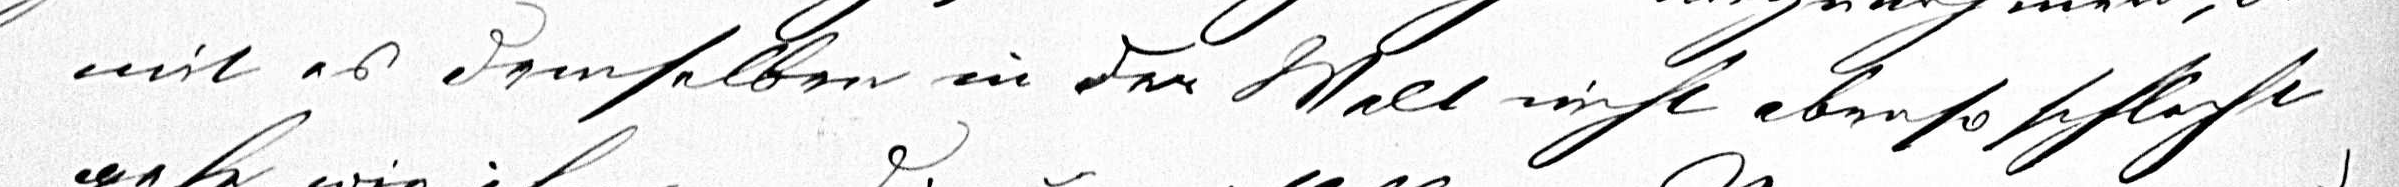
mit es demselben in der Welt nicht ebenso schlecht
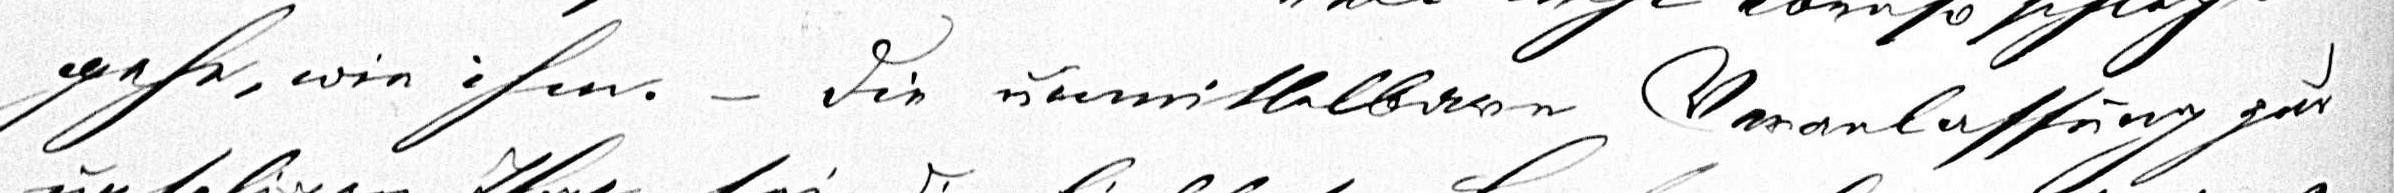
gehe, wie ihm.- Die unmittelbare Veranlassung zur
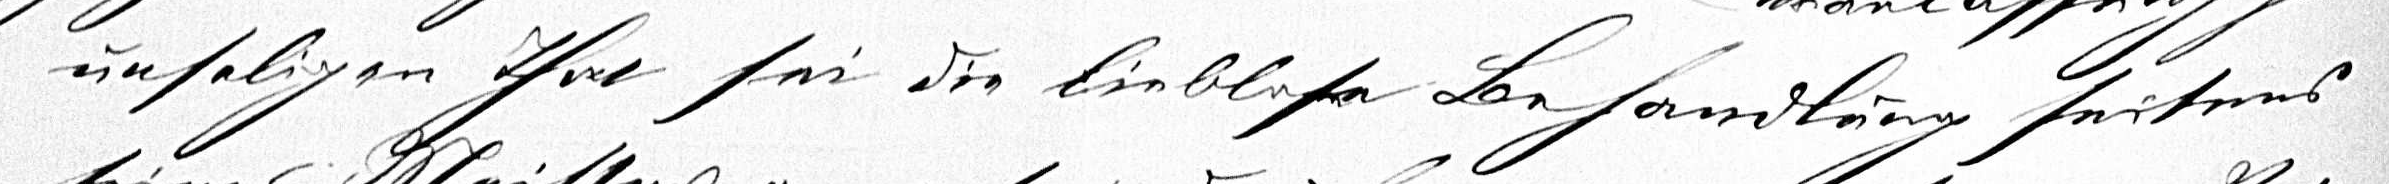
unseligen That sei die lieblose Behandlung seitens
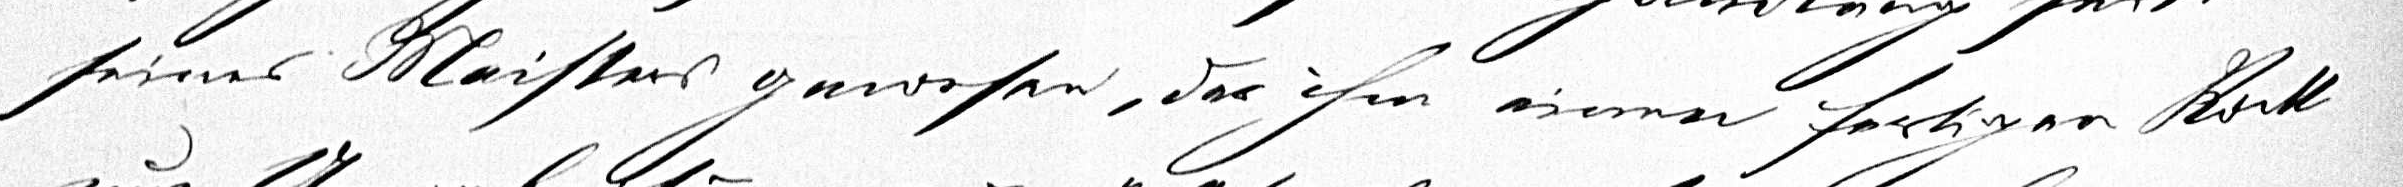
seines Meisters gewesen, der ihm einen fertigen Rock
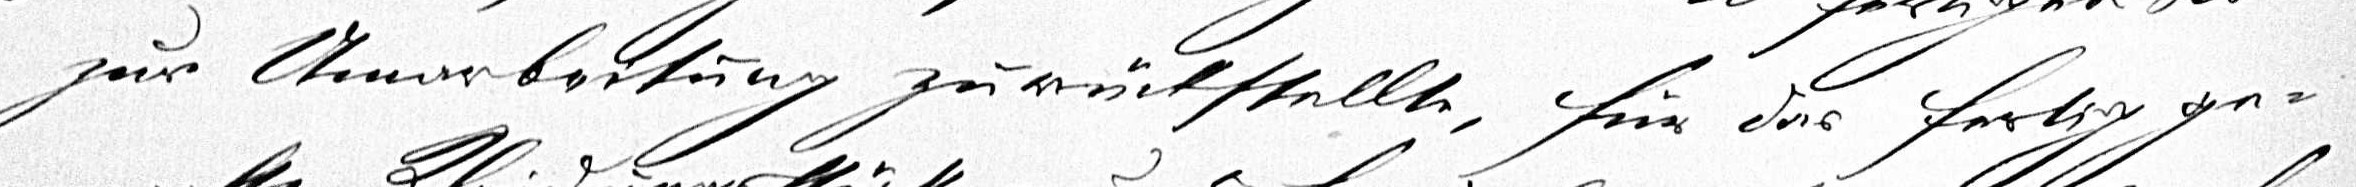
zur Umarbeitung zurückstellte, für das fertig ge¬
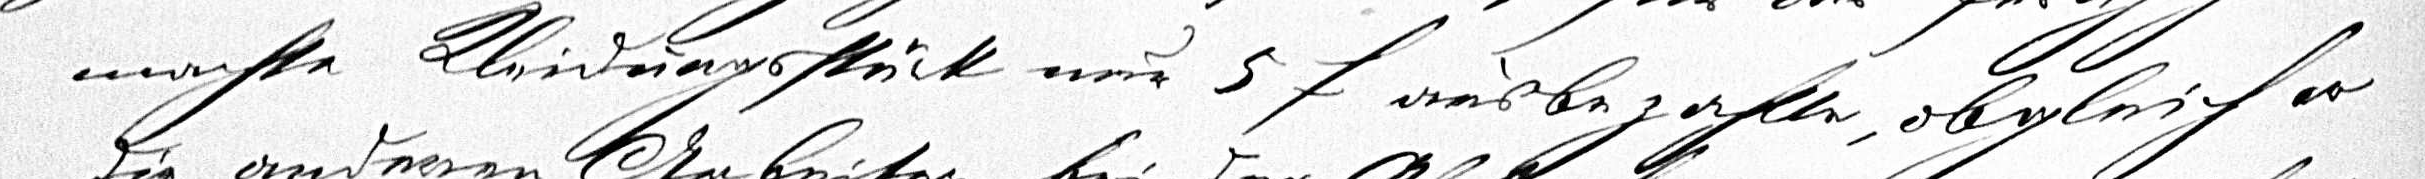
machte Kleidungsstück nur 5f ausbezahlte, obgleich er
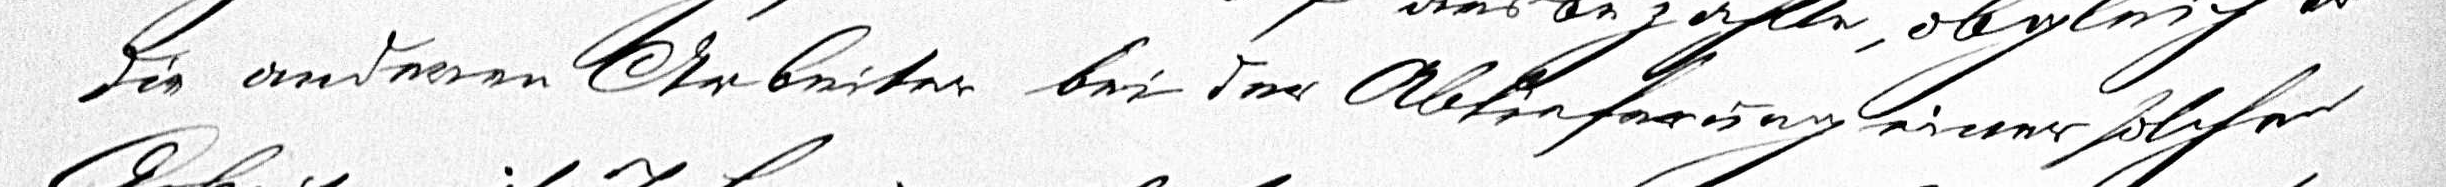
die anderen Arbeiter bei der Ablieferung einer solchen
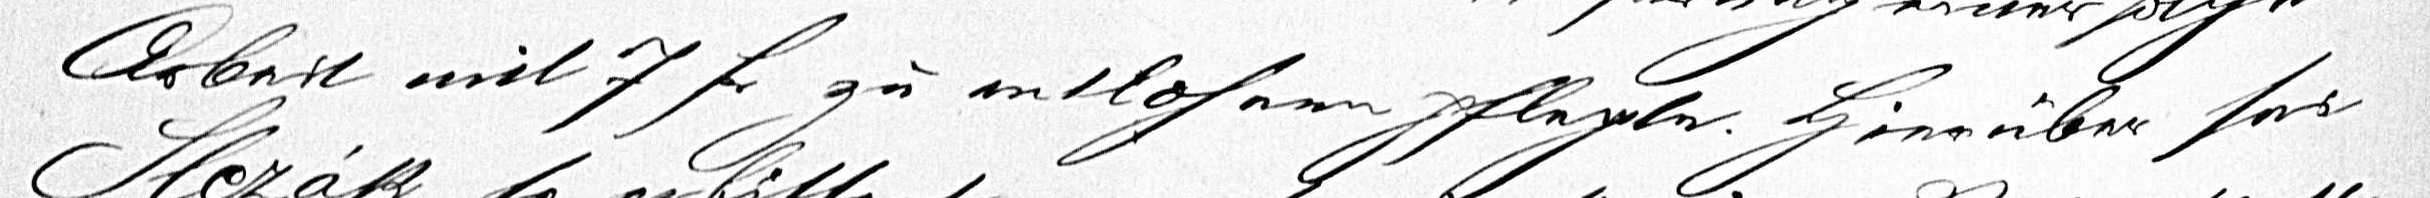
Arbeit mit 7 fr zu entlohnen pflegte. Hierüber sei
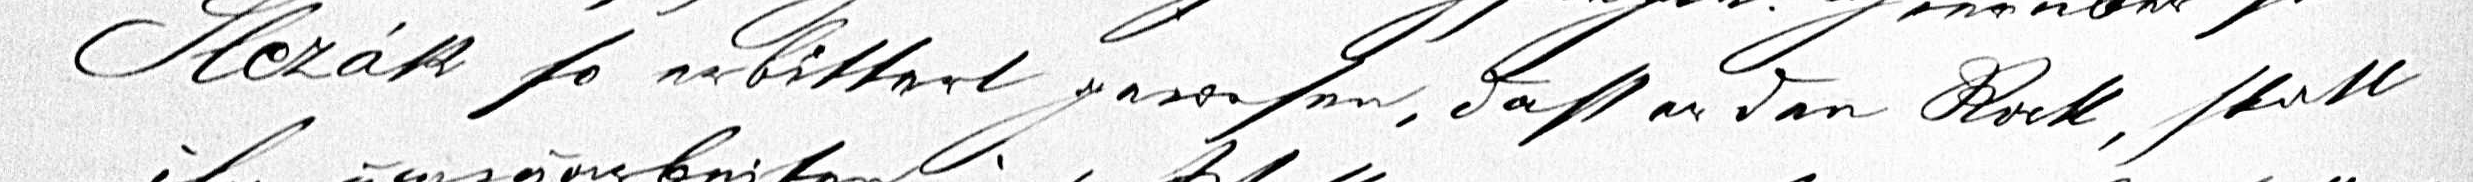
Slezák so erbittert gewesen, daß er den Rock, statt
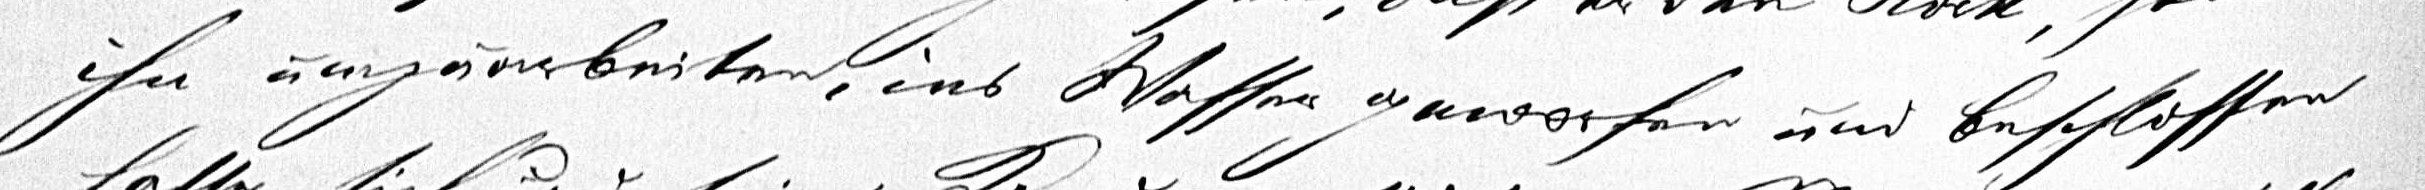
ihn umzuarbeiten, ins Wasser geworfen und beschlossen
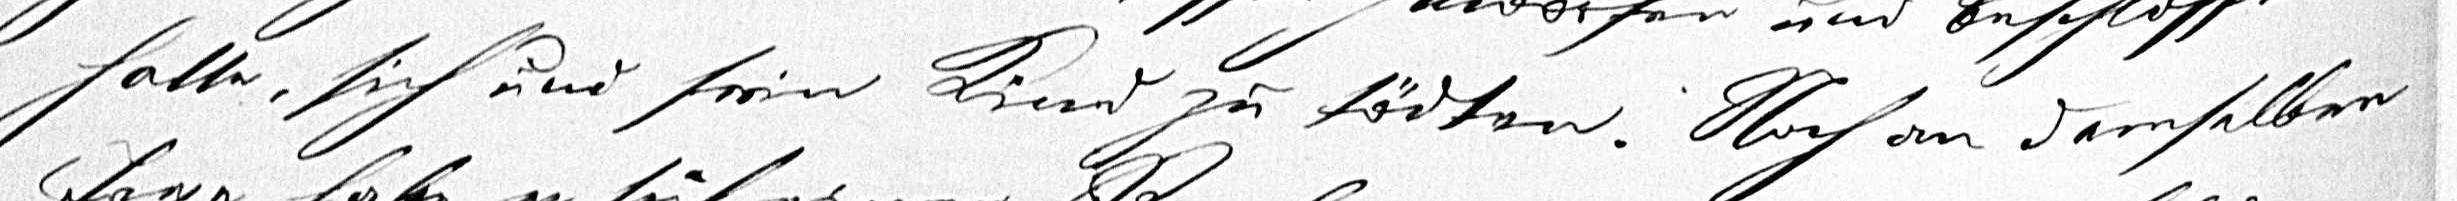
hatte, sich und sein Kind zu tödten. Noch an demselben
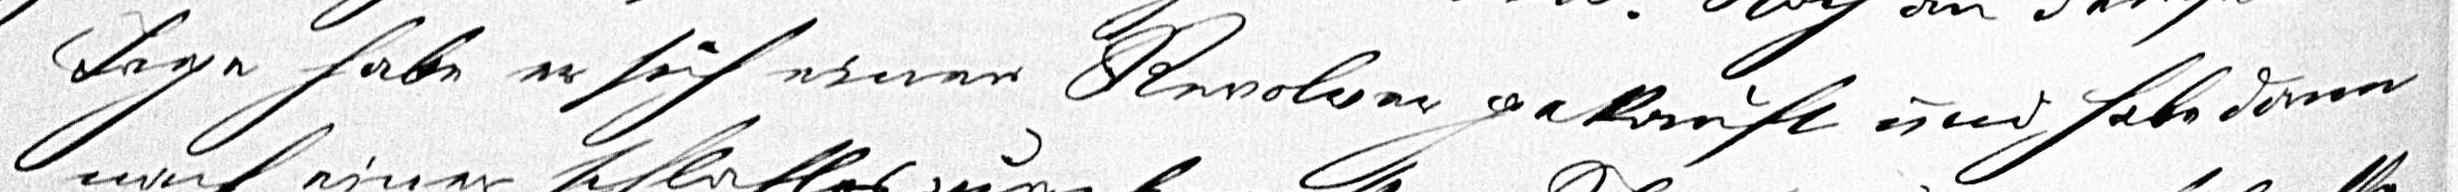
Tage habe er sich einen Revolver gekauft und habe dann
